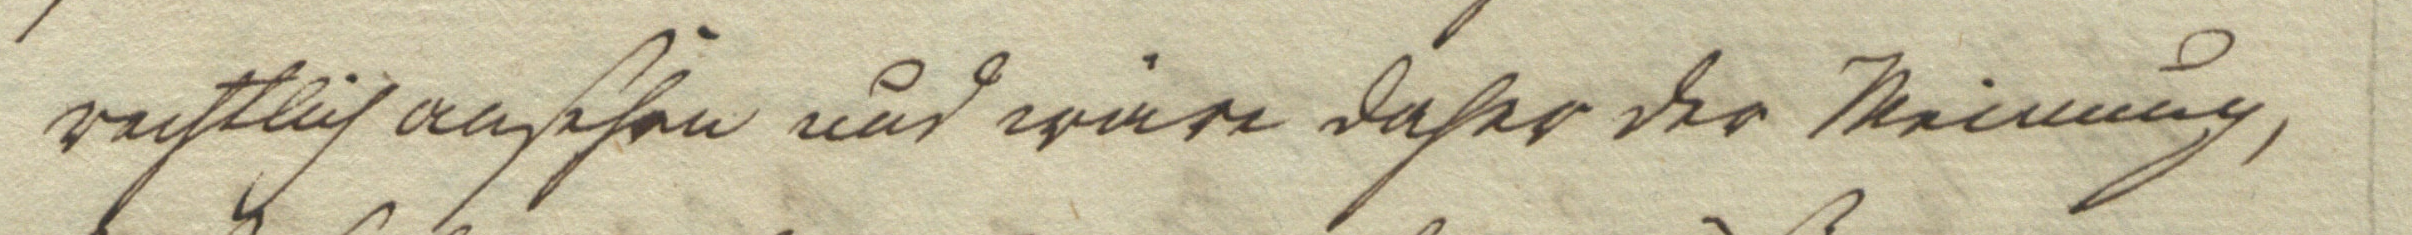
rechtlich ansehen und wäre daher der Meinung,
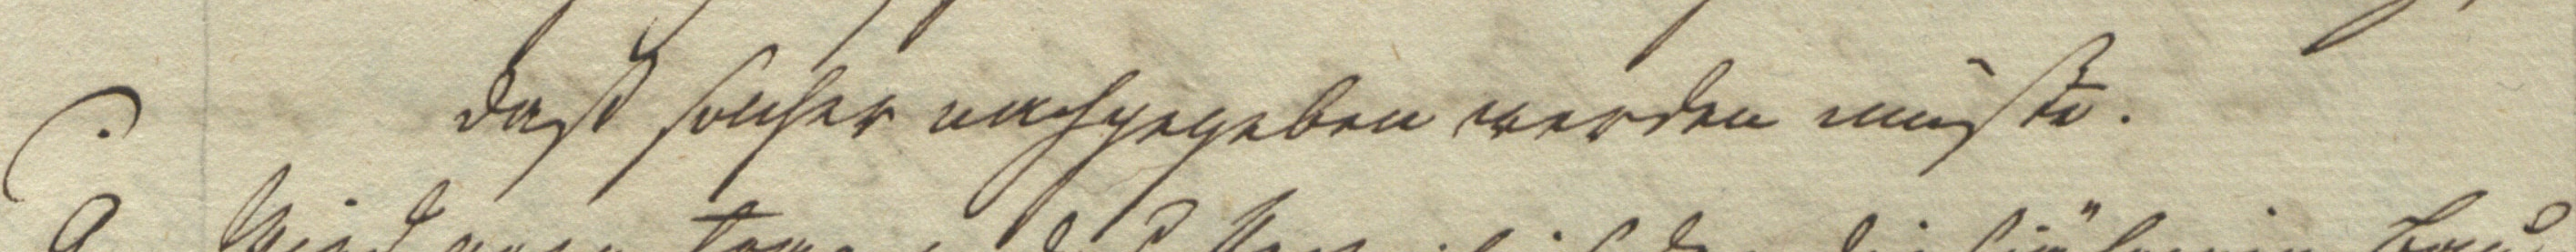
daß solcher nachgegeben werden müßte.
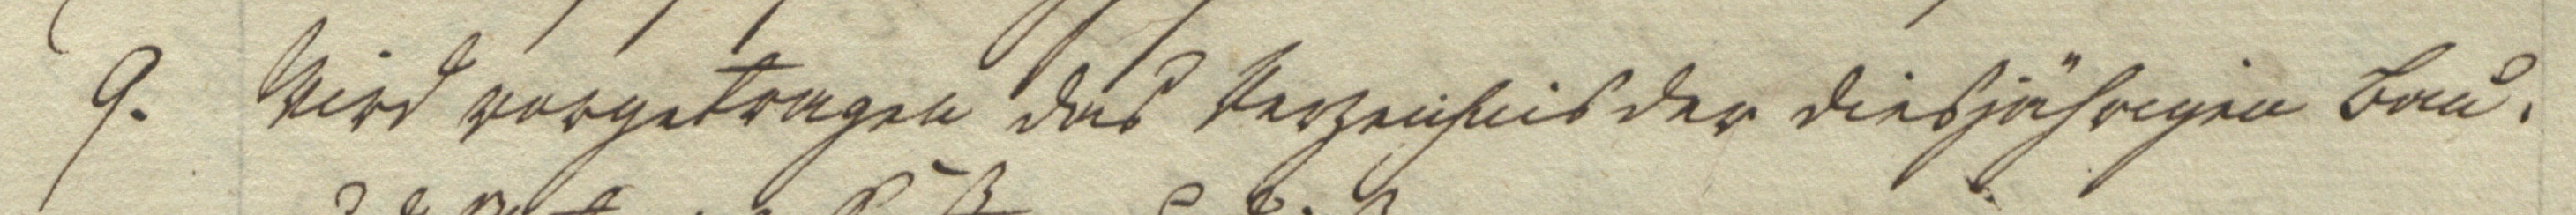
9. Wird vorgetragen das Verzeichnis der diesjährigen Bau—
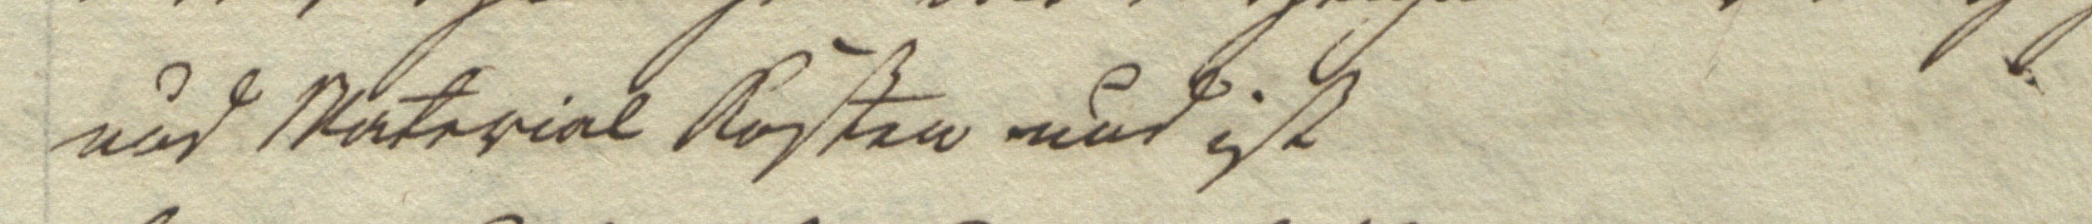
und Material Kosten und ist
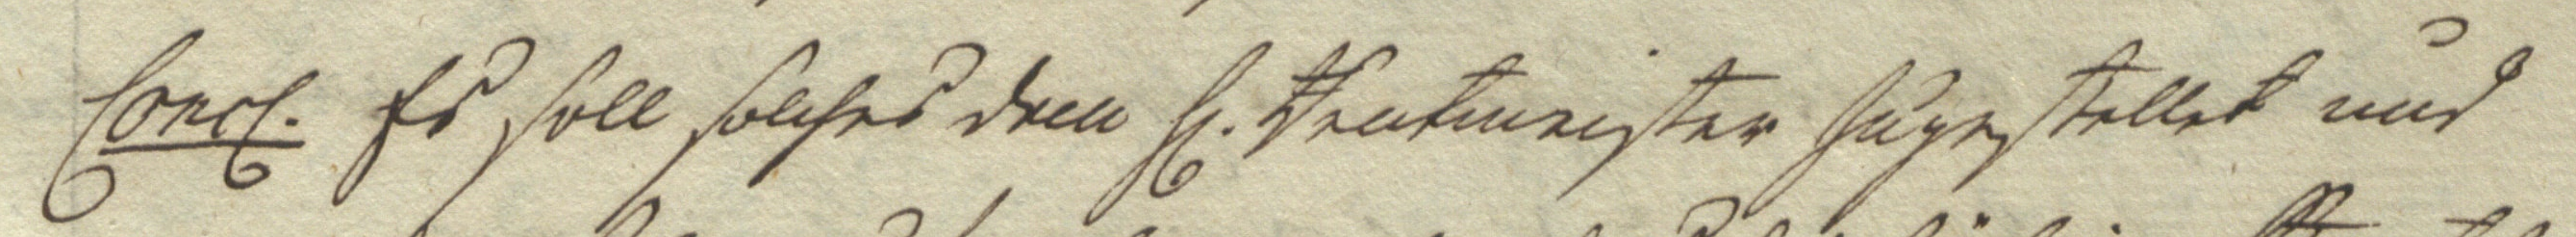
Concl. Es soll solches dh. Rentmeister zugestellet und
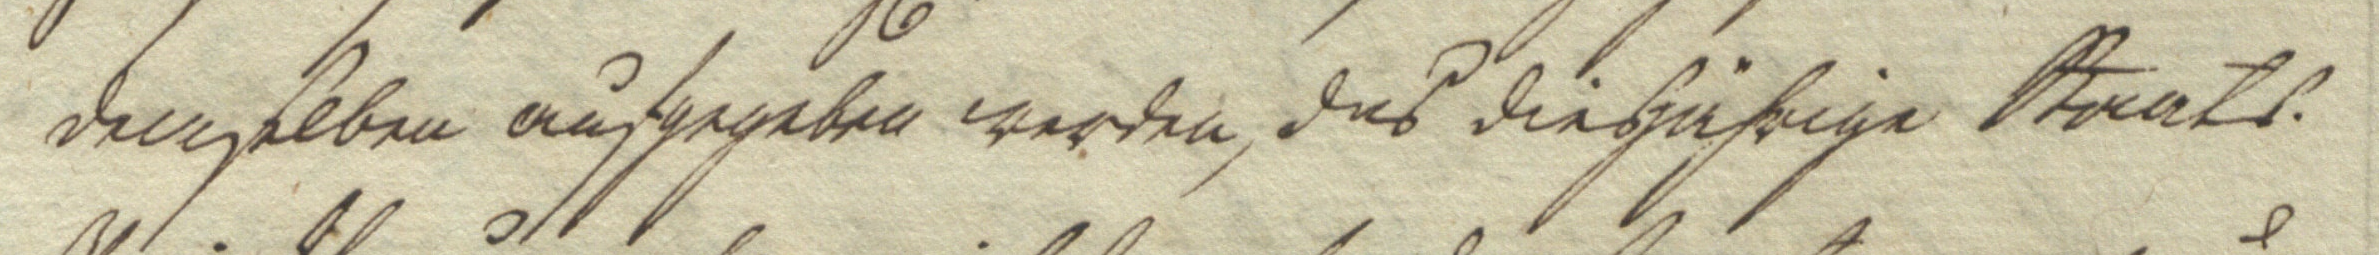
demselben aufgegeben werden, das diesjährige Staats—
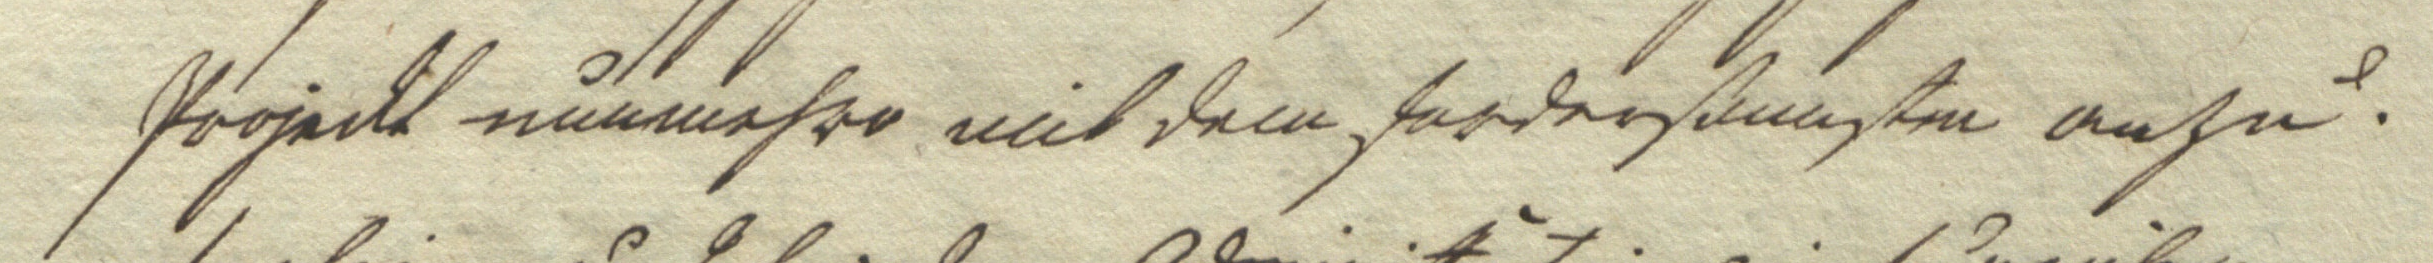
Projekt nunmehro mit dem fordersamsten anzu¬
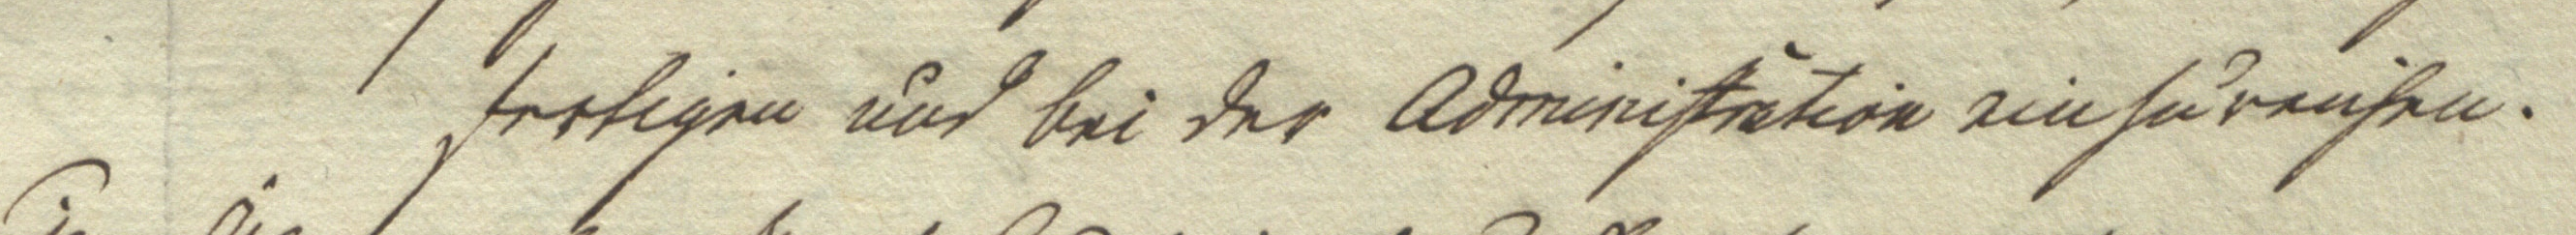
fertigen und bei der Administration einzureichen.
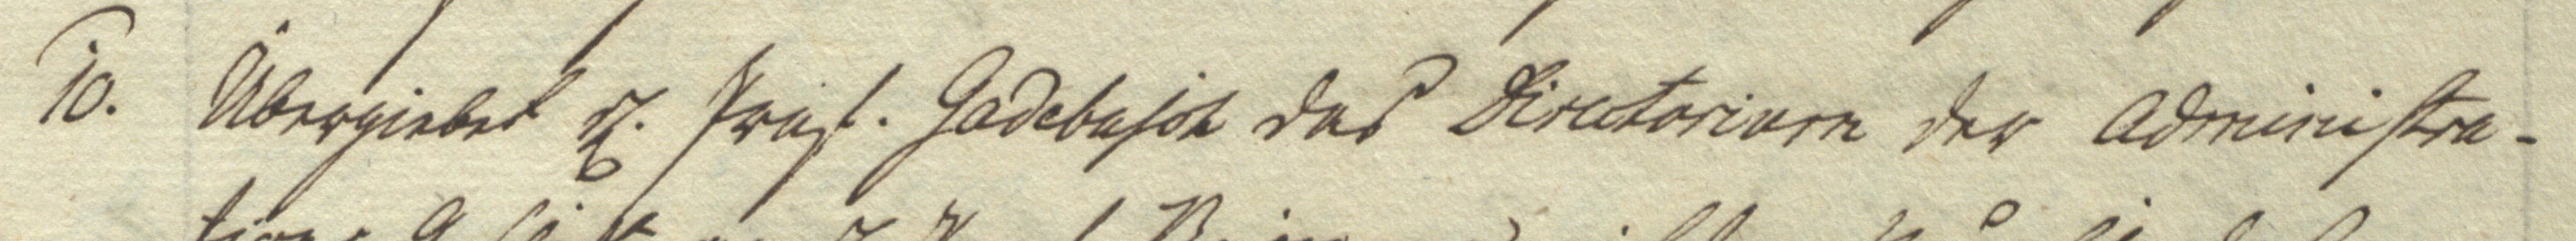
10. Übergiebet dh. Pras. Gadebusch das Directorium der Administra¬
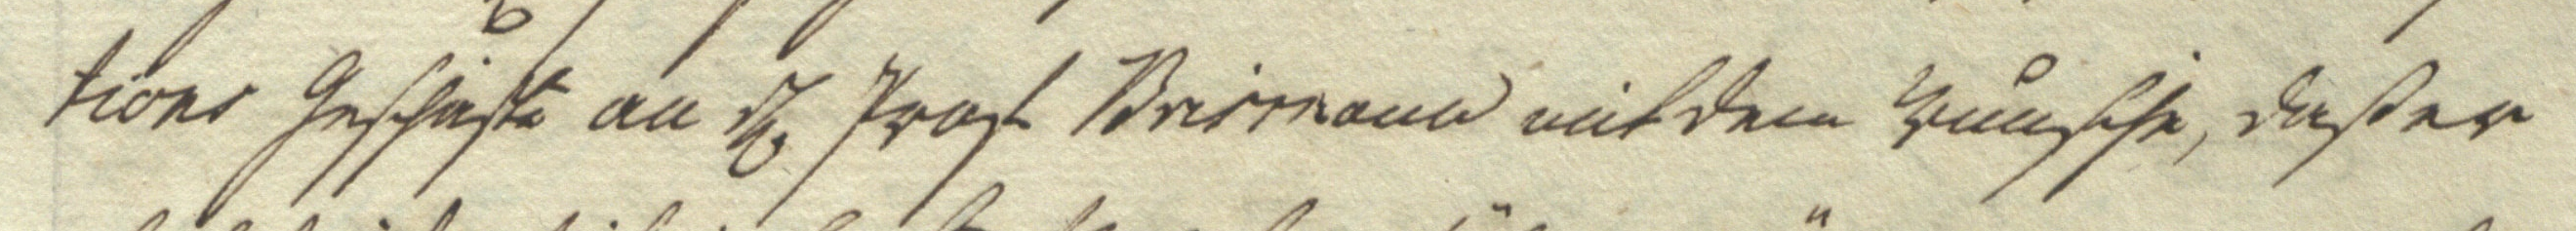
tions Geschäfte an dh. Prof. Brismann mit dem Wunsche, daß er
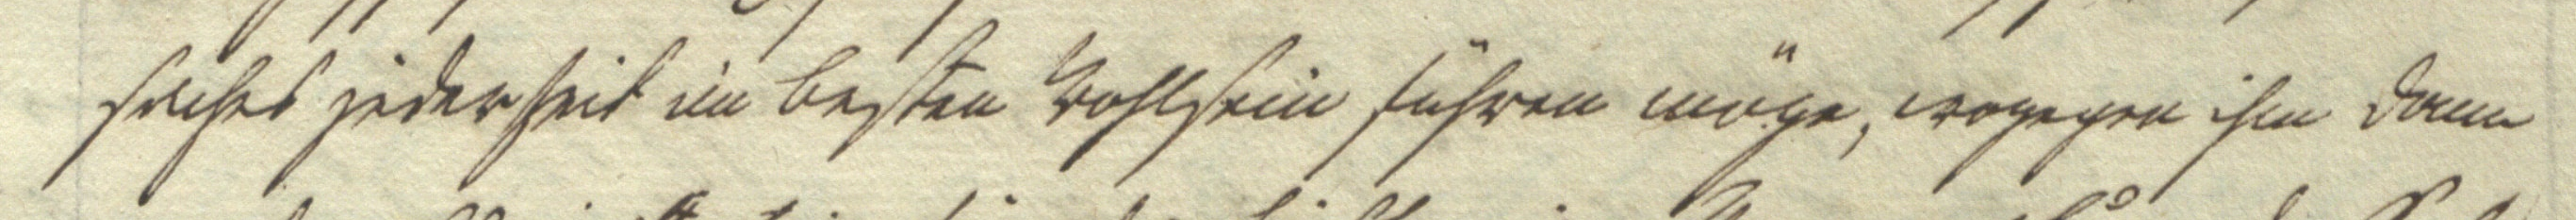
solches jederzeit im besten Wohlsein führen möge, wogegen ihm dann
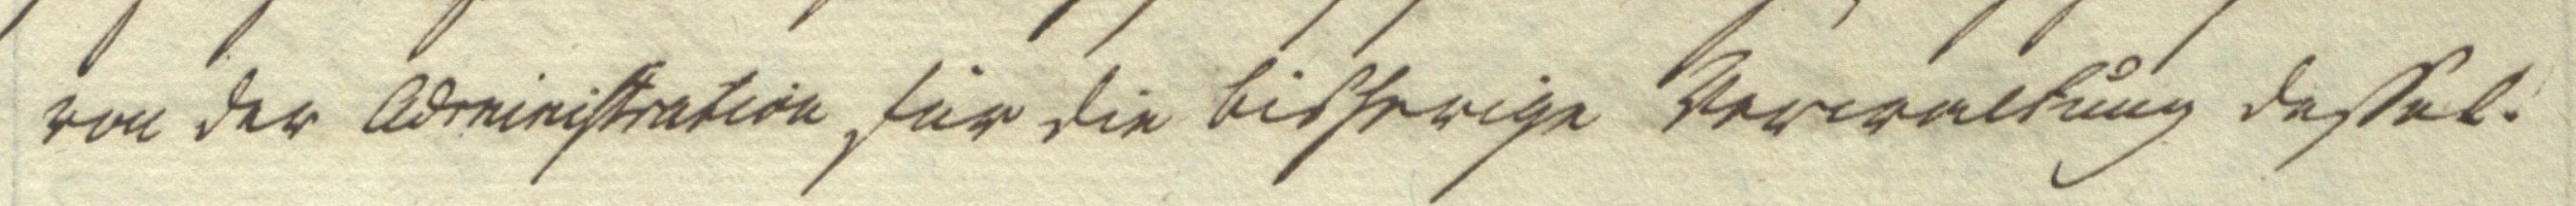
von der Administration für die bisherige Verwaltung dessel¬
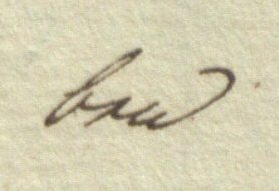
ben
